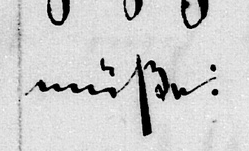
müße:
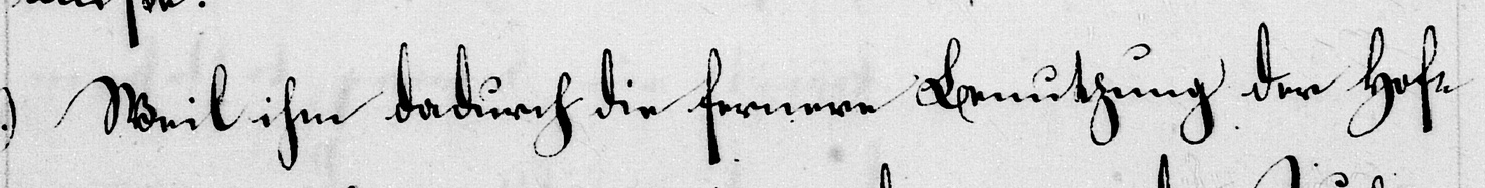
Weil ihm dadurch die fernere Benutzung der Hof¬
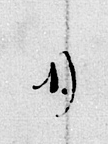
1.)
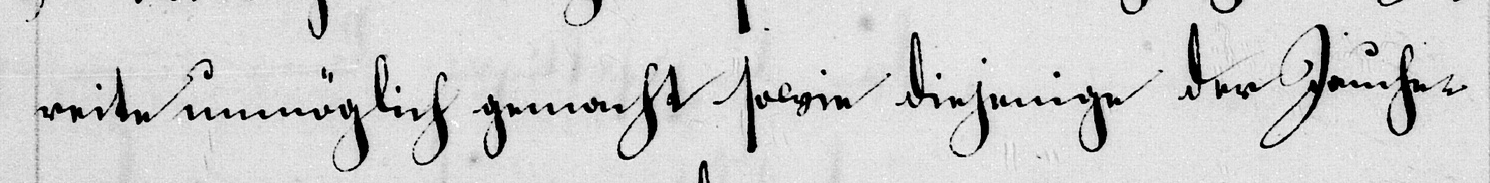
reite unmöglich gemacht sowie diejenige der Jauche¬
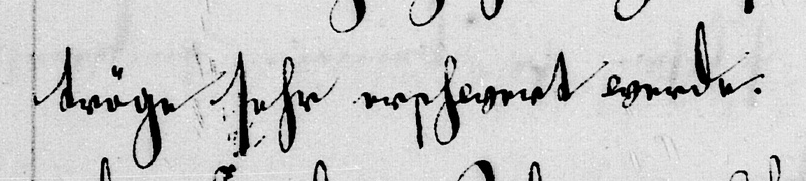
tröge sehr erschwert werde.
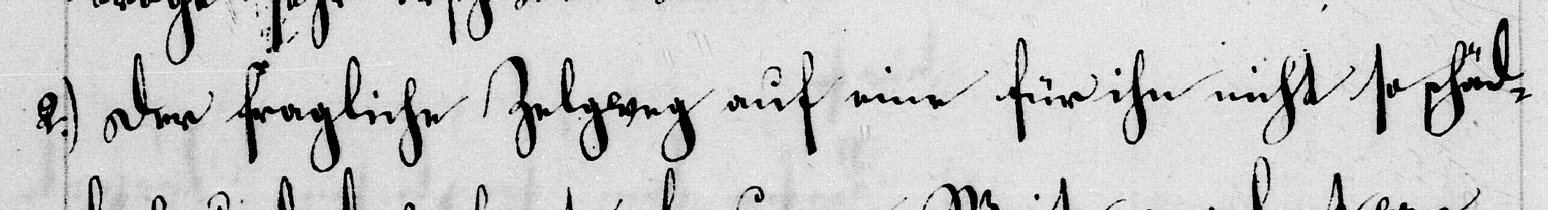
2.) Der fragliche Zelgweg auf eine für ihn nicht so schäd¬
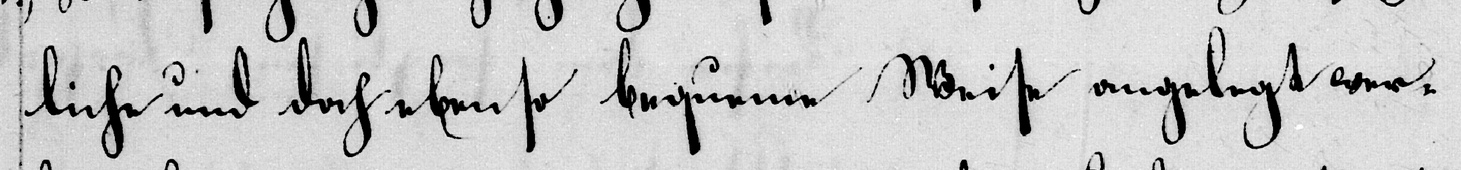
liche und doch ebenso bequeme Weise angelegt wer¬
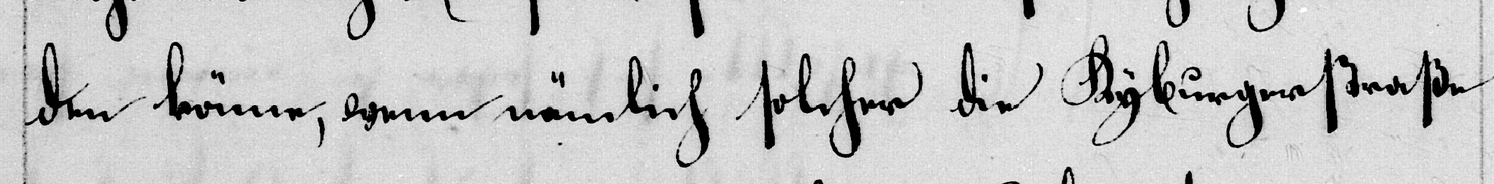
den könne, wenn nämlich solcher die Kyburgerstraße
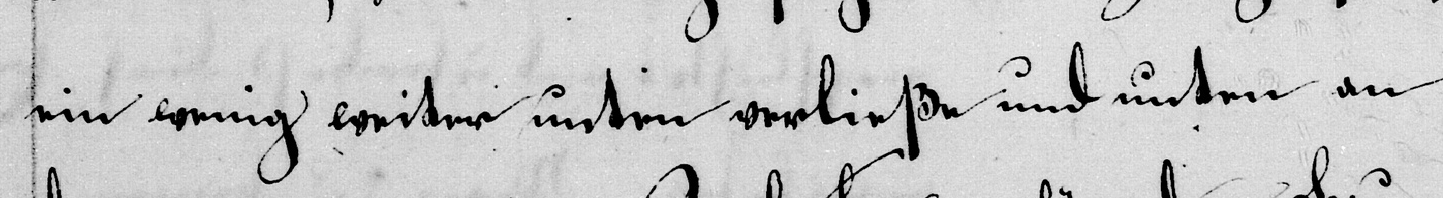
ein wenig weiter unten verließe und unten an
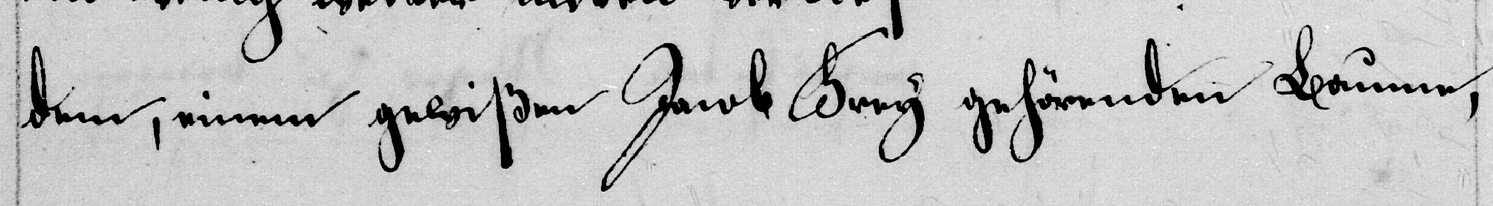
dem, einem gewißen Jacob Frey gehörenden Baume,
